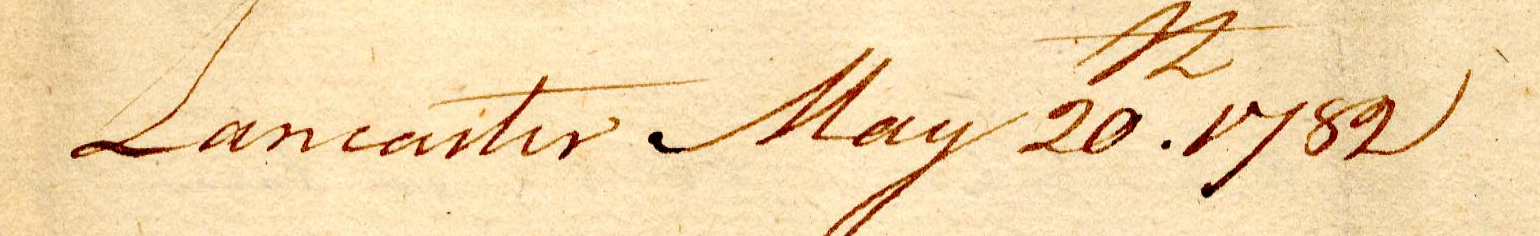Lancaster May 20^th. 1782
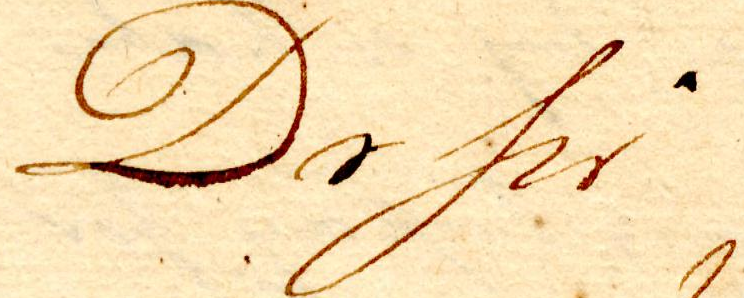Dr Sir
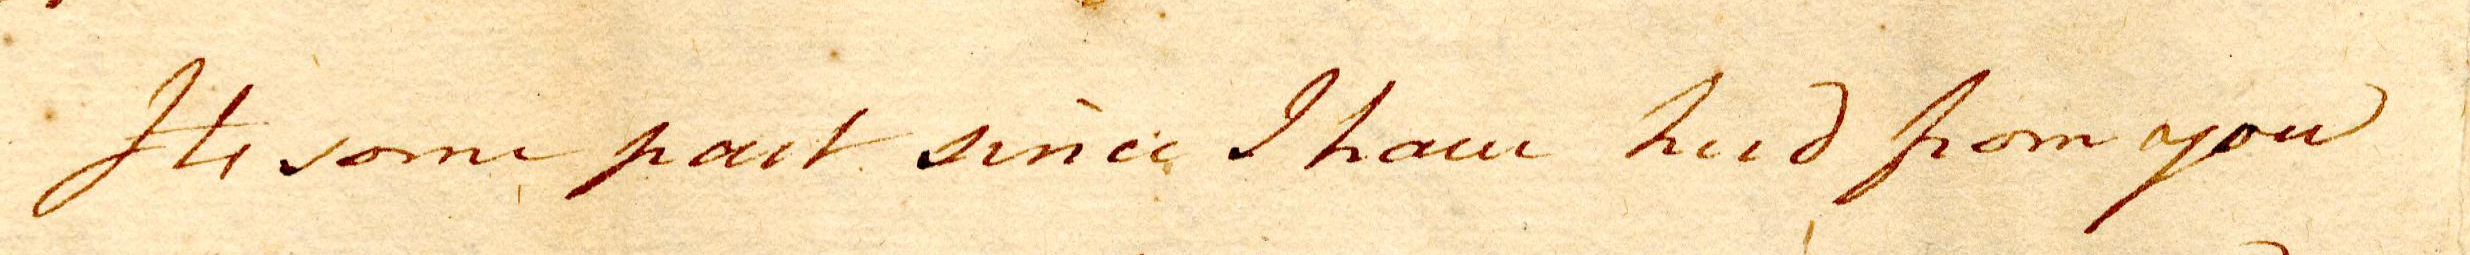Its some past since I have herd from you`
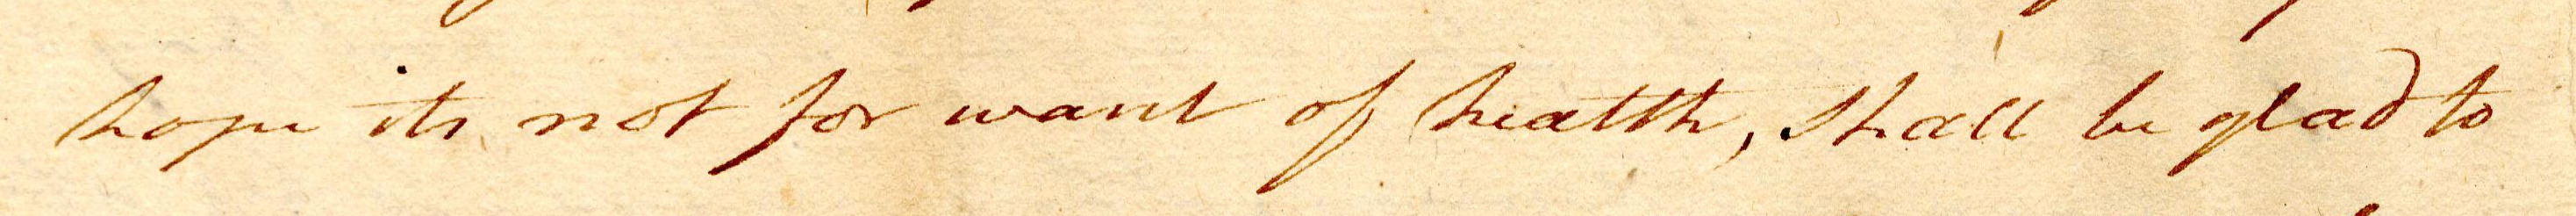hope its not for want of health, shall be glad to
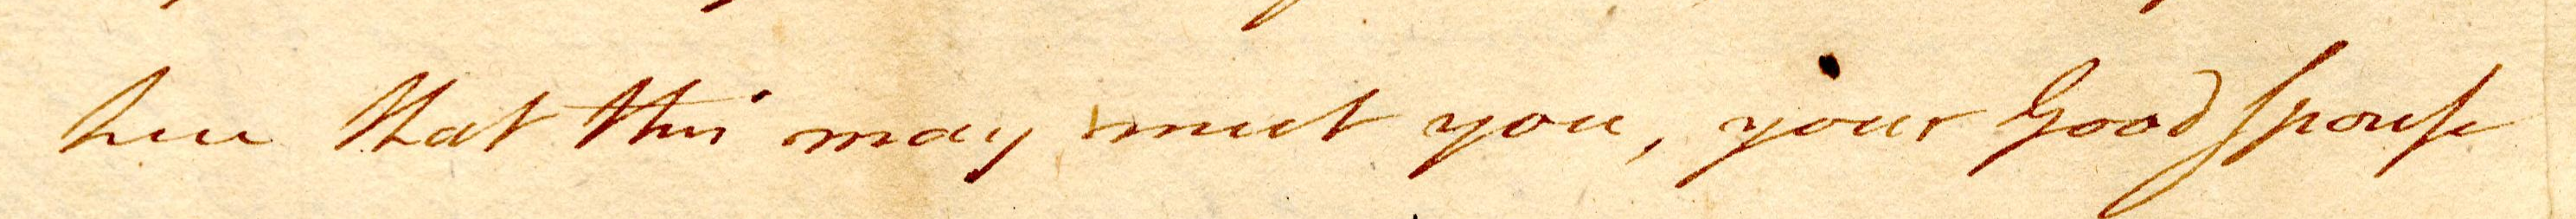here that this May meet you, your Good spouse
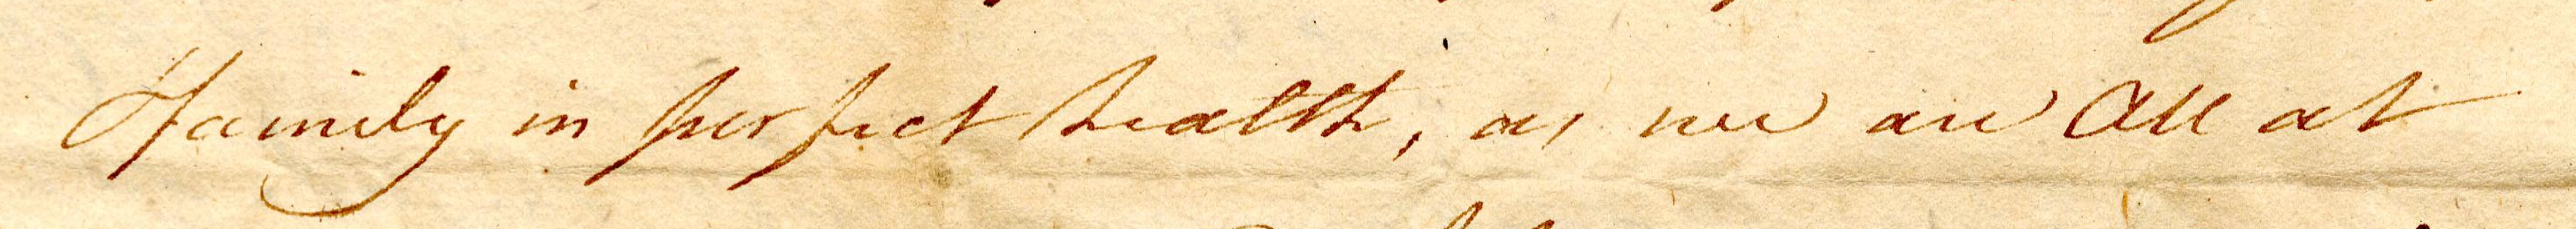& family in perfect health, as we are All at
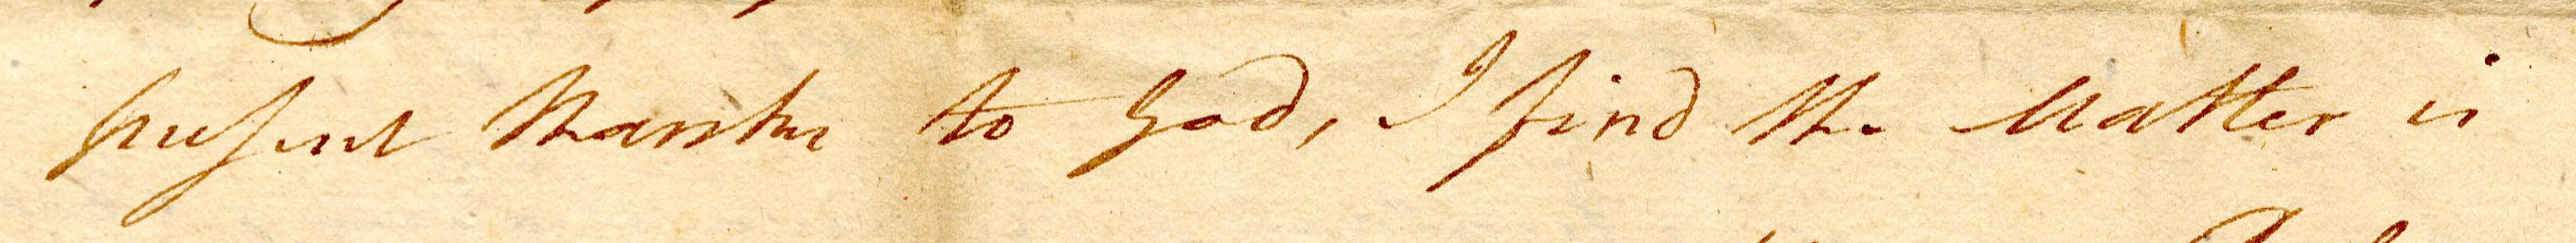present thanks to god, I find the Matter is
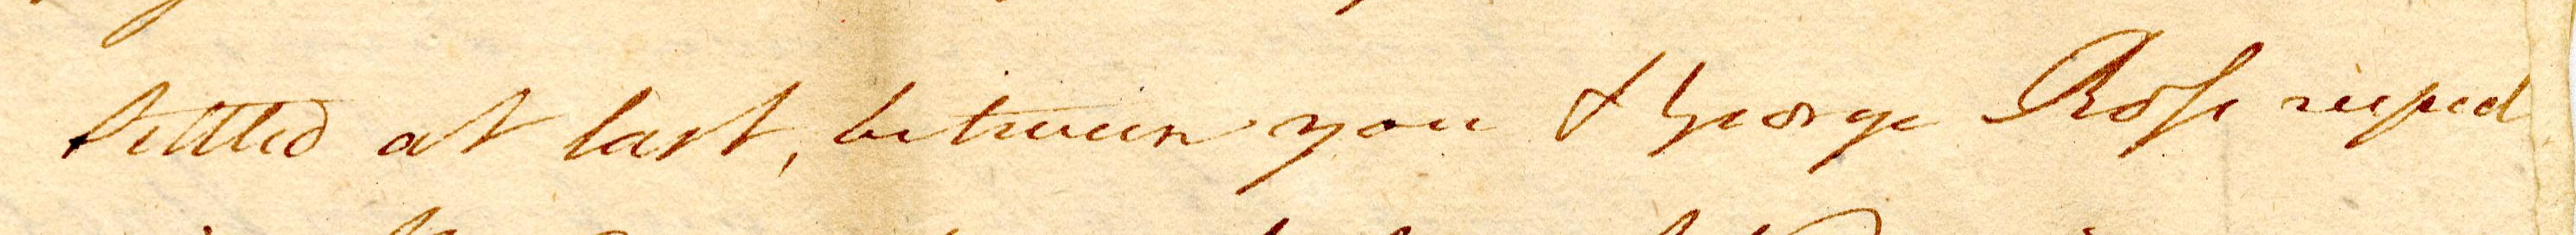Setlled at last, between you & George Ross respect-
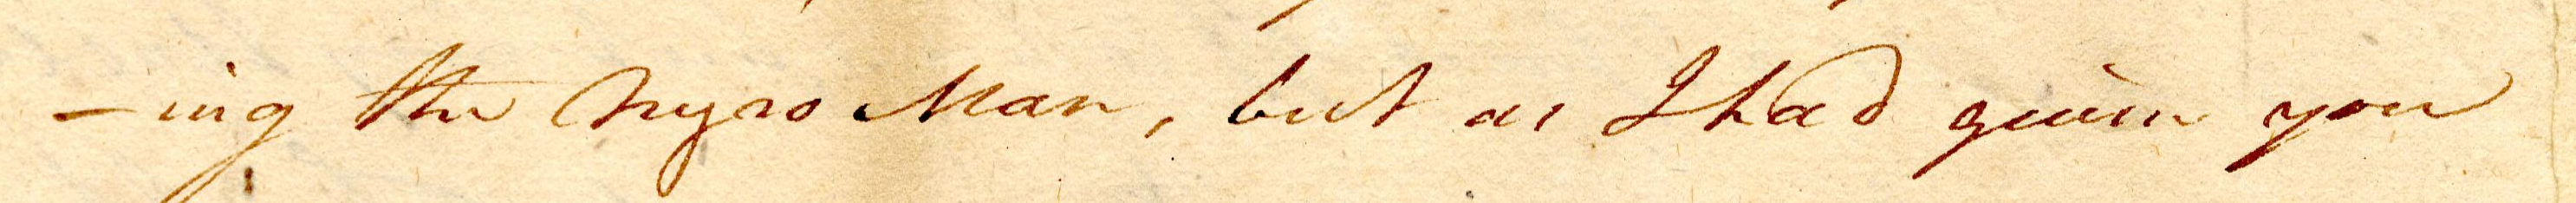-ing the Nyrs Man, but as I had given you
